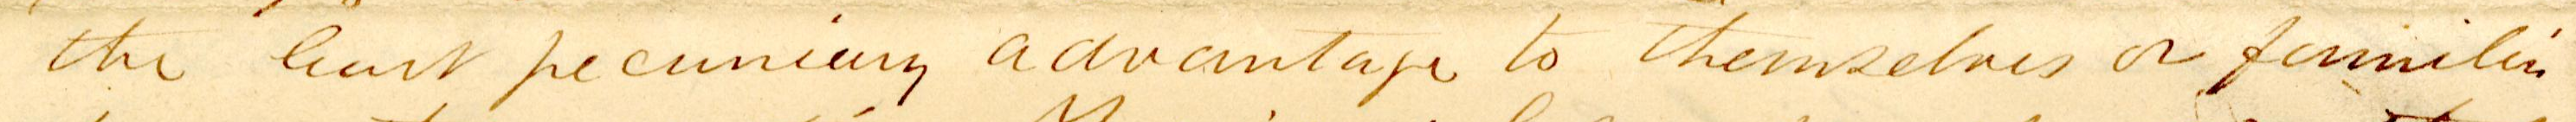the court pecuniary advantage to themselves or families
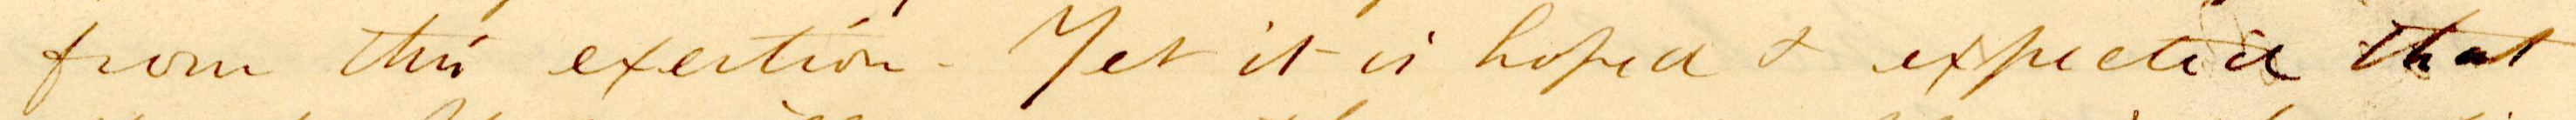from this exertion. Yet it is hoped & expected that
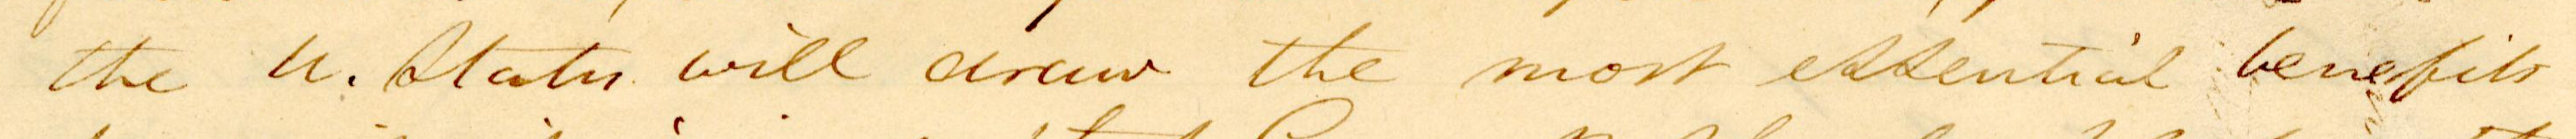the U. States will draw the most essential benefits
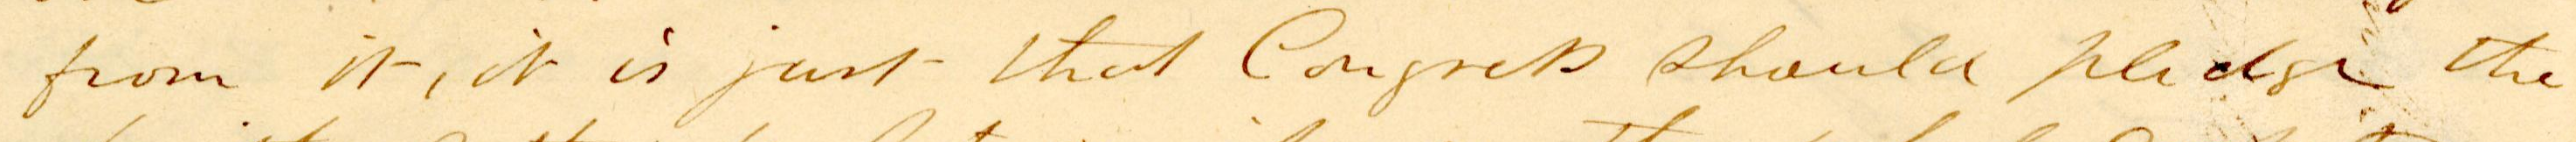from it, it is just that Congress should please the
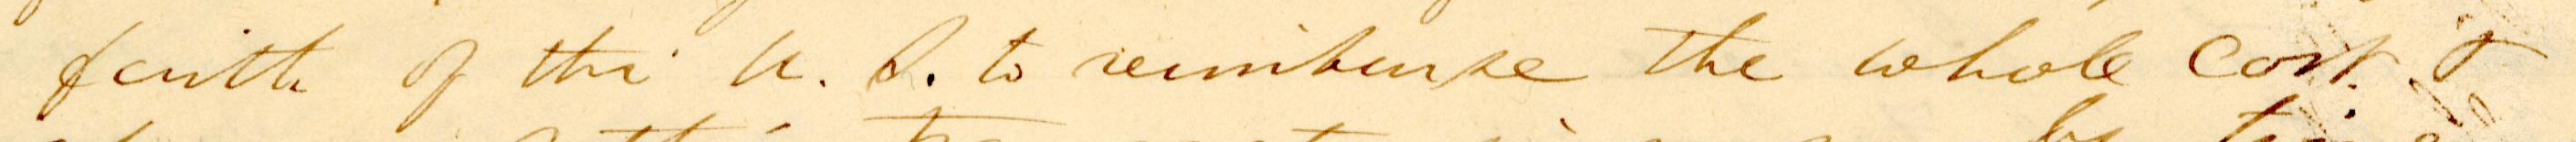faith of the U. S. to reimburse the whole Cost &
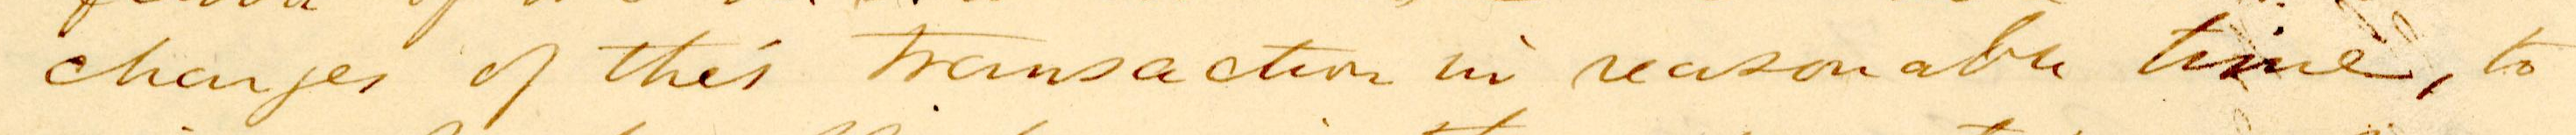charges of this transaction in reasonable time, to
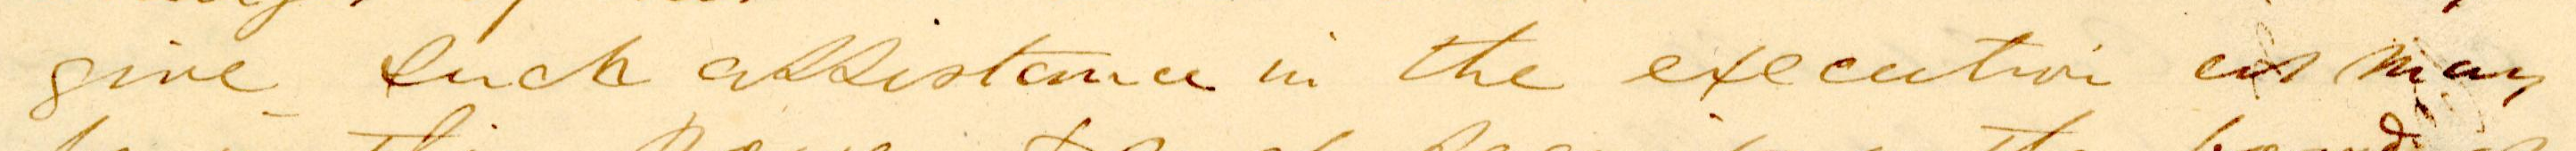give such assistance in the execution it may
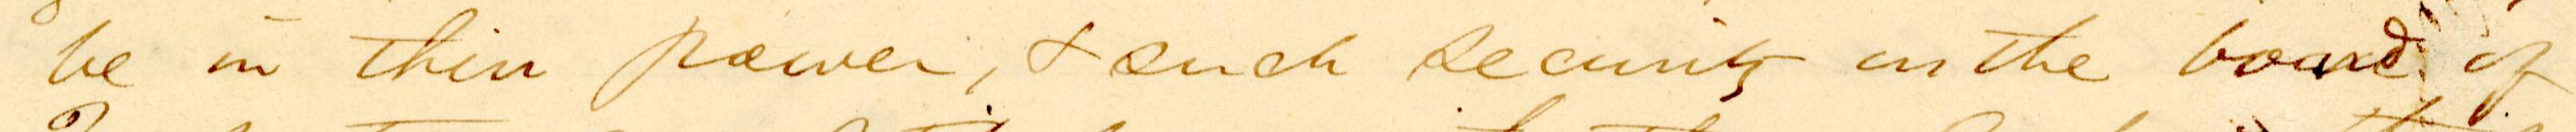be in their power, & such security as the board of
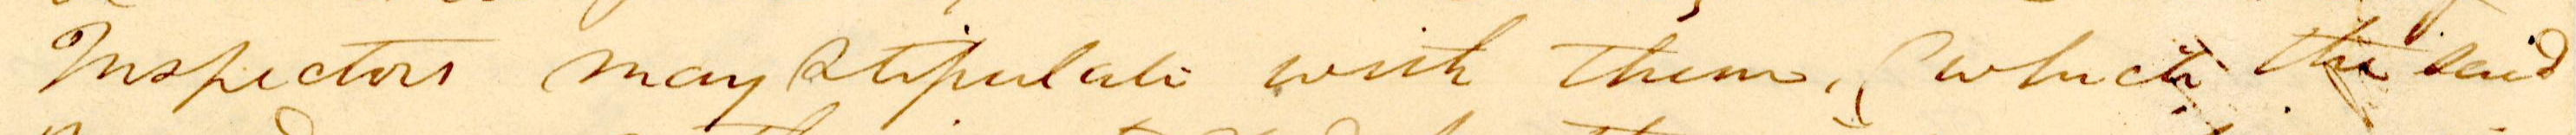Inspectors may stipulate with them. (which the said
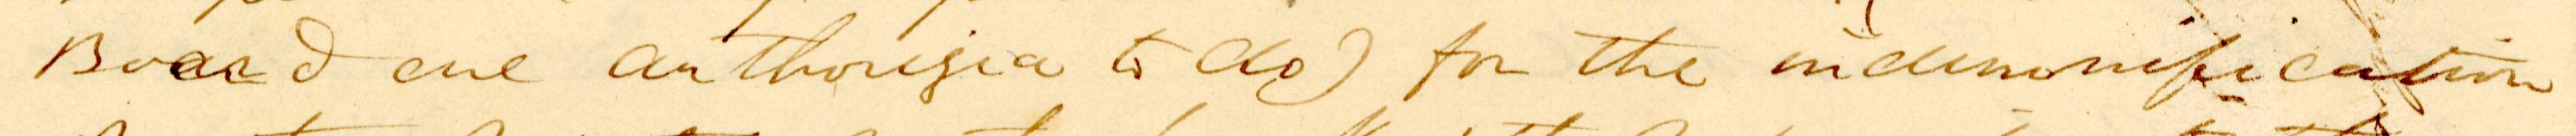Board are authorized to do) for the indemnification
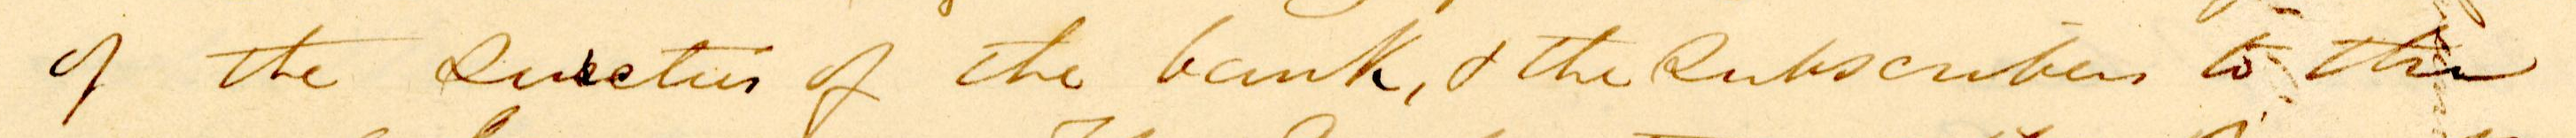of the Qualities of the bank, & the Subscribers to the
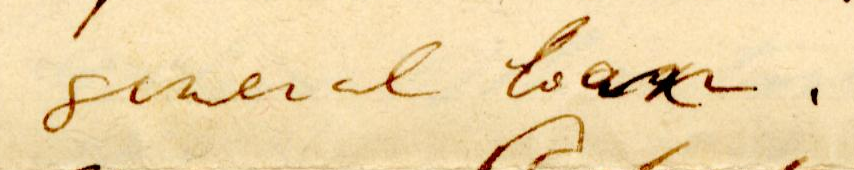general bank.
